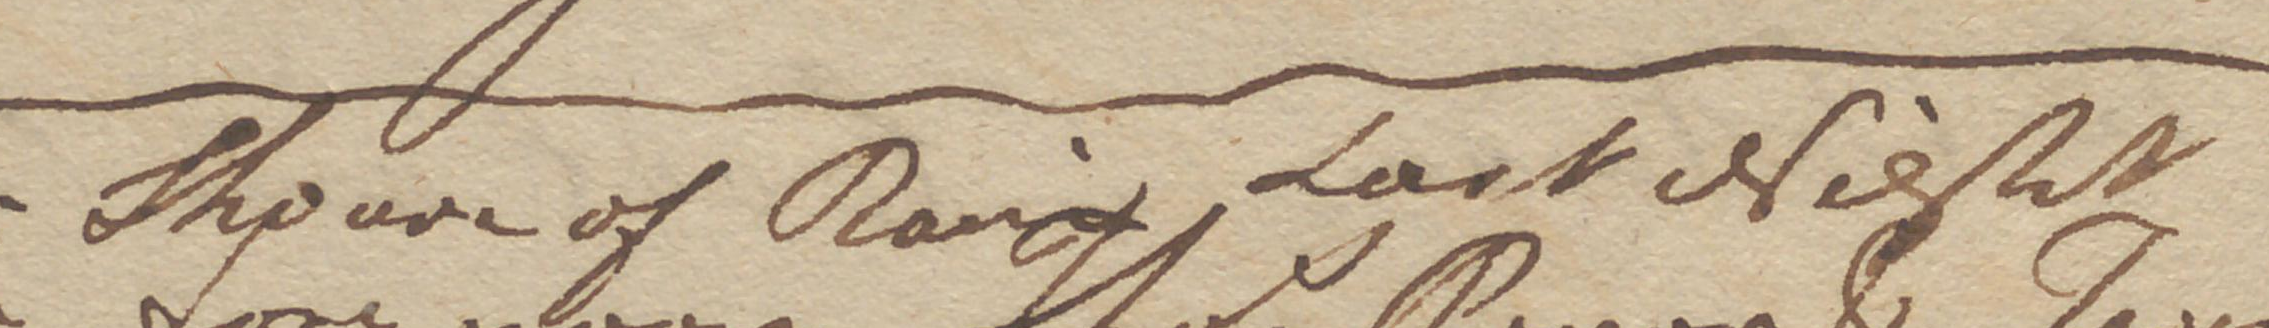Shoure of Rain Last Night
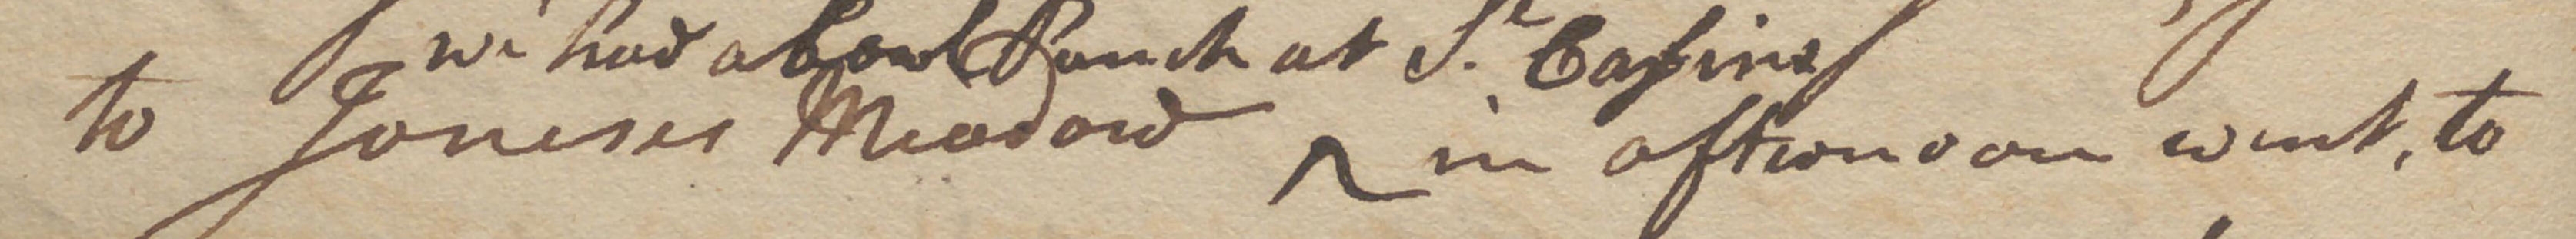to Joneses Meedow ^ in afternoon went to
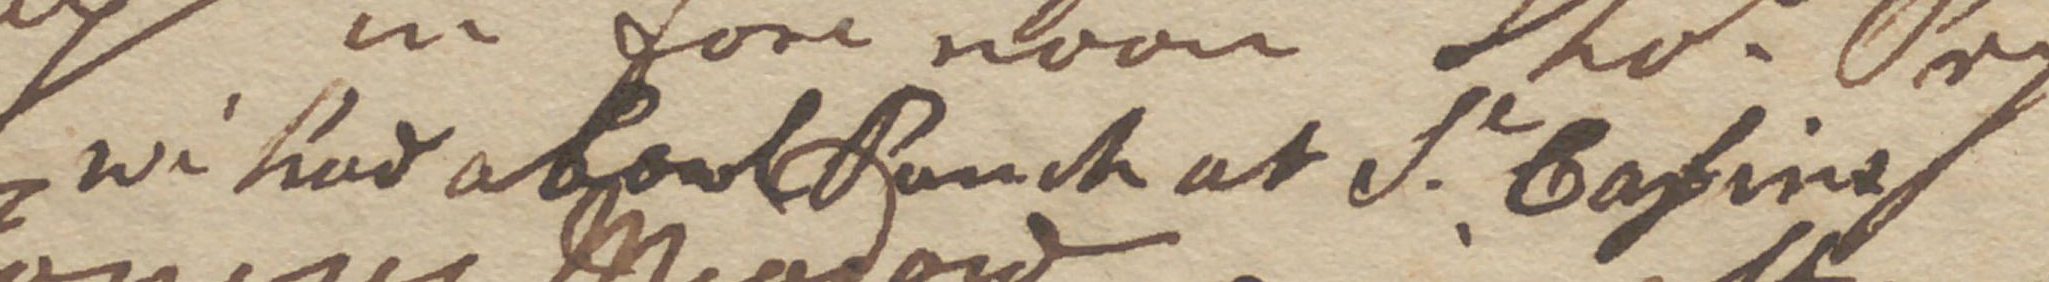we had a bowl Punch at S^l. Casins
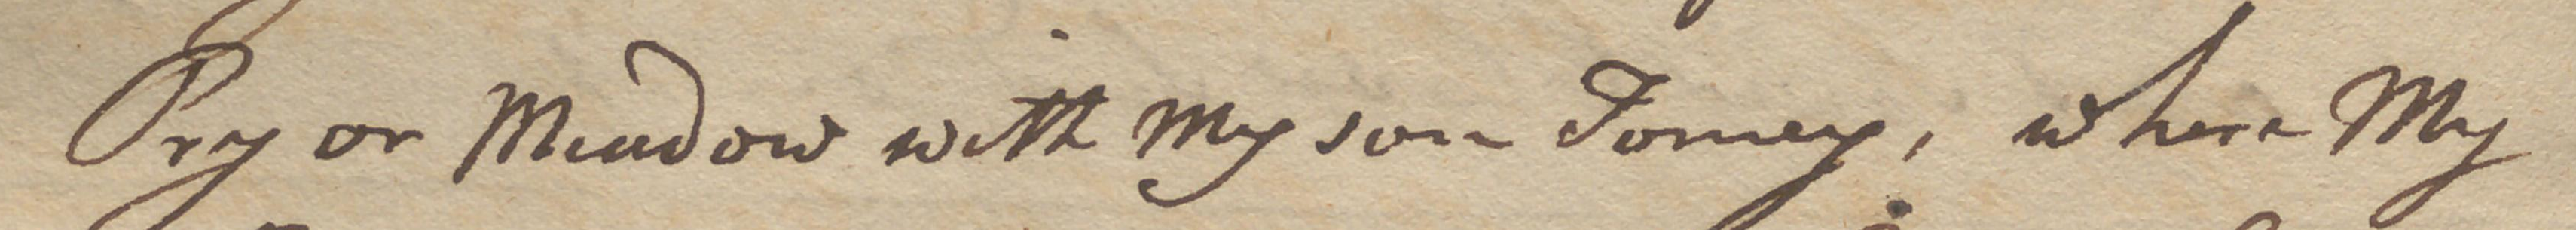Pryor Meadow with my son Tomey, where My
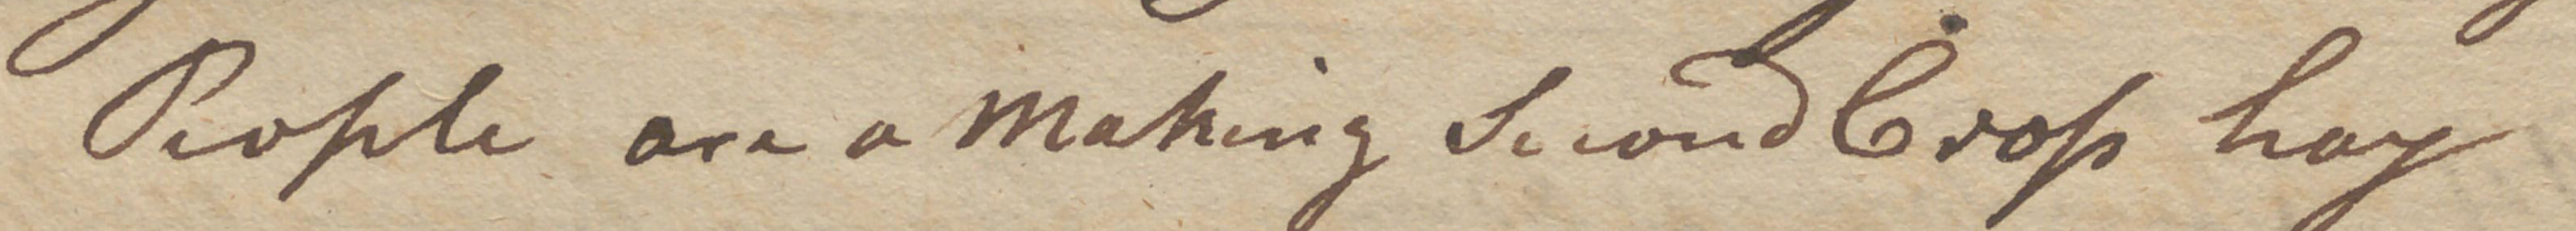People are a making second Crop hay
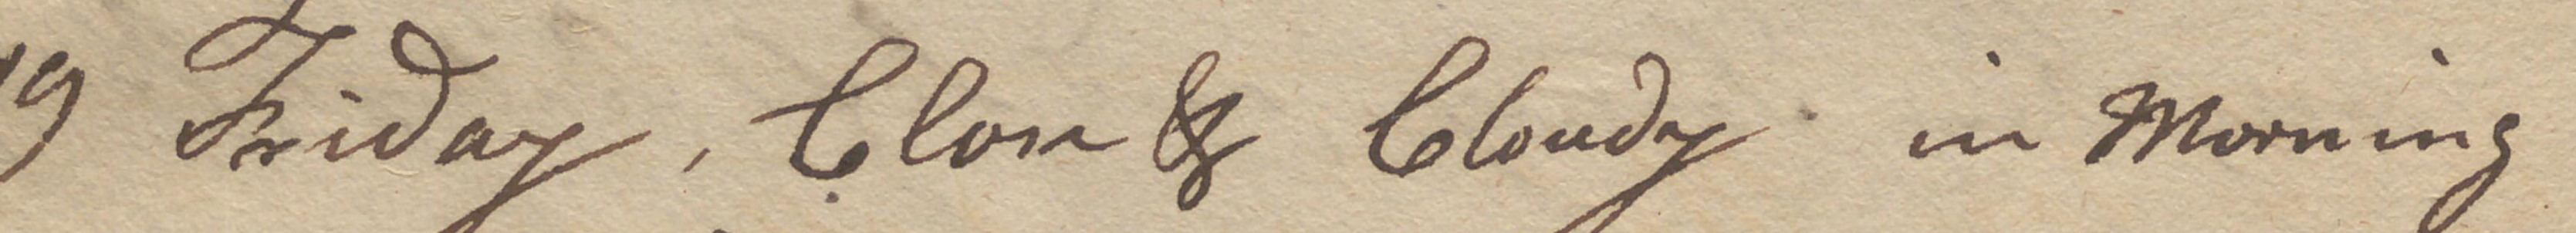19 Friday. Close & Cloudy in Morning
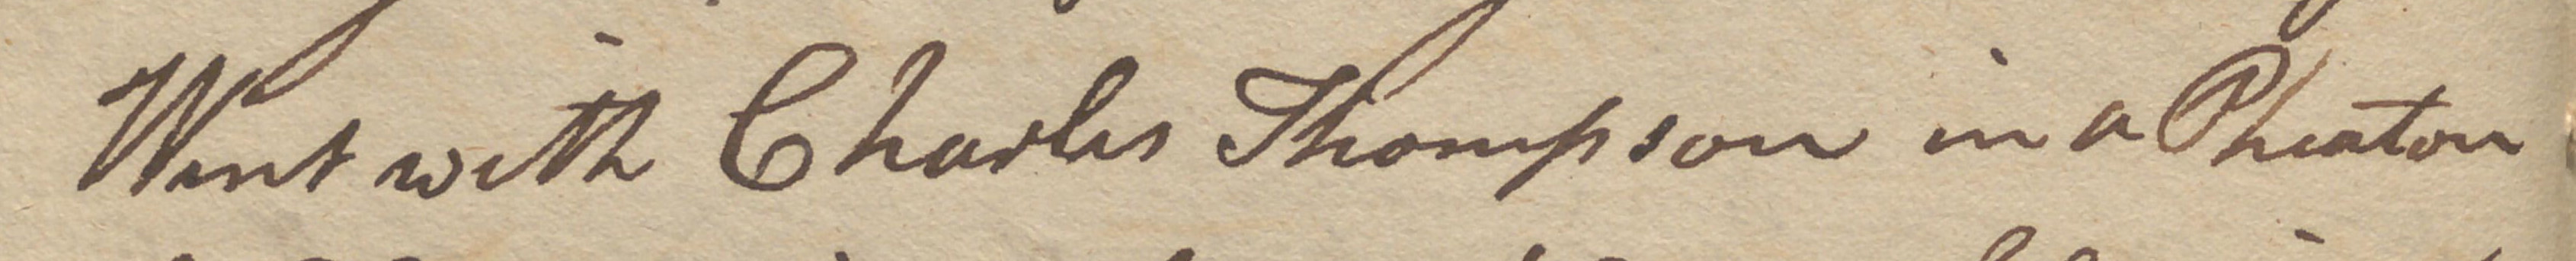Went with Charles Thompson in a Pheaton
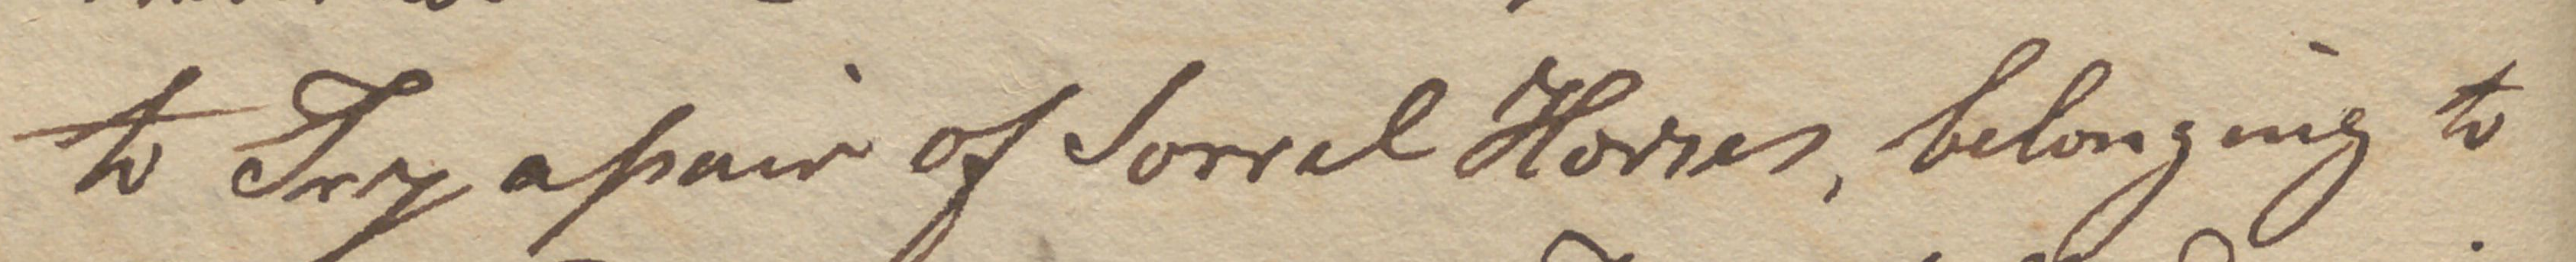to Try a pair of Sorrel Horses, belonging to
